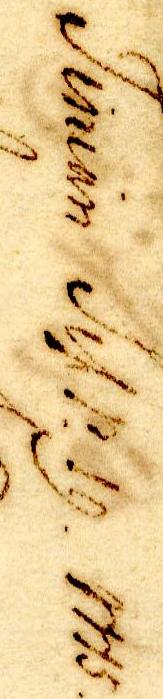Tinian Sep^r. 19. 1775.
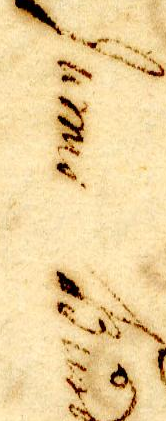James Burd
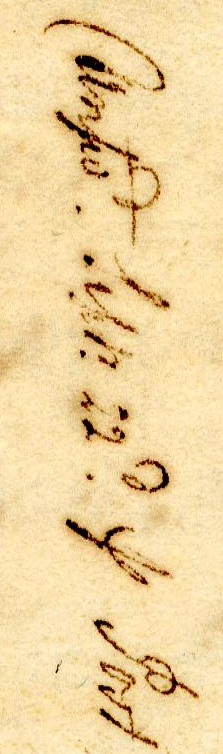(Answ^d. Sept^r. 22^d. per Post)
